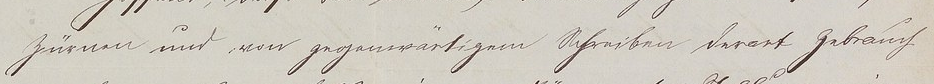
zürnen und von gegenwärtigem Schreiben derart Gebrauch
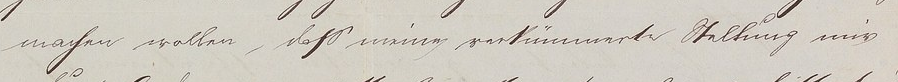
machen wollen, daß meine verkümmerte Stellung mir
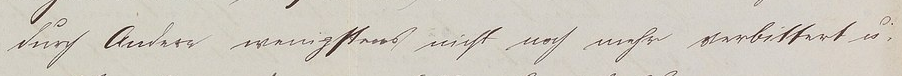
durch Andere wenigstens nicht noch mehr verbittert u.
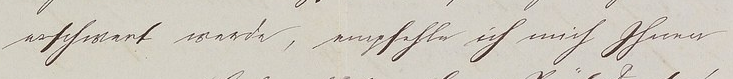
erschwert werde, empfehle ich mich Ihnen
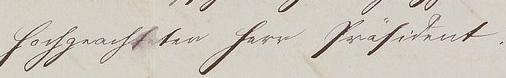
Hochgeachteter Herr Präsident!
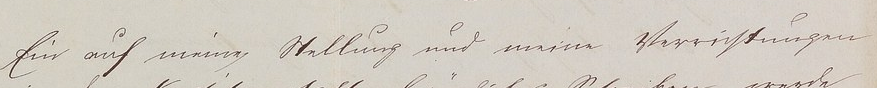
Ein auf meine Stellung und meine Verrichtungen
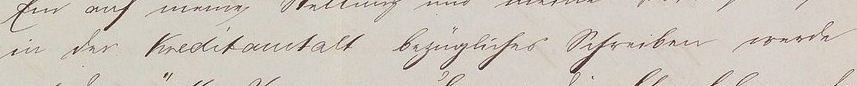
in der Kreditanstalt bezügliches Schreiben werde
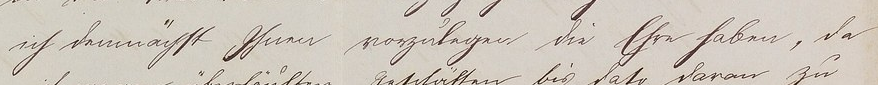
ich demnächst Ihnen vorzulegen die Ehre haben, da
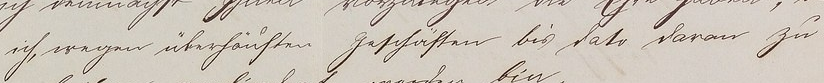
ich, wegen überhäuften Geschäften bis dato daran zu
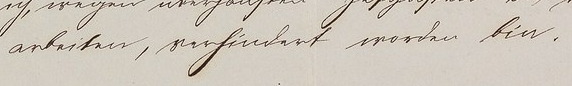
arbeiten, verhindert worden bin.
